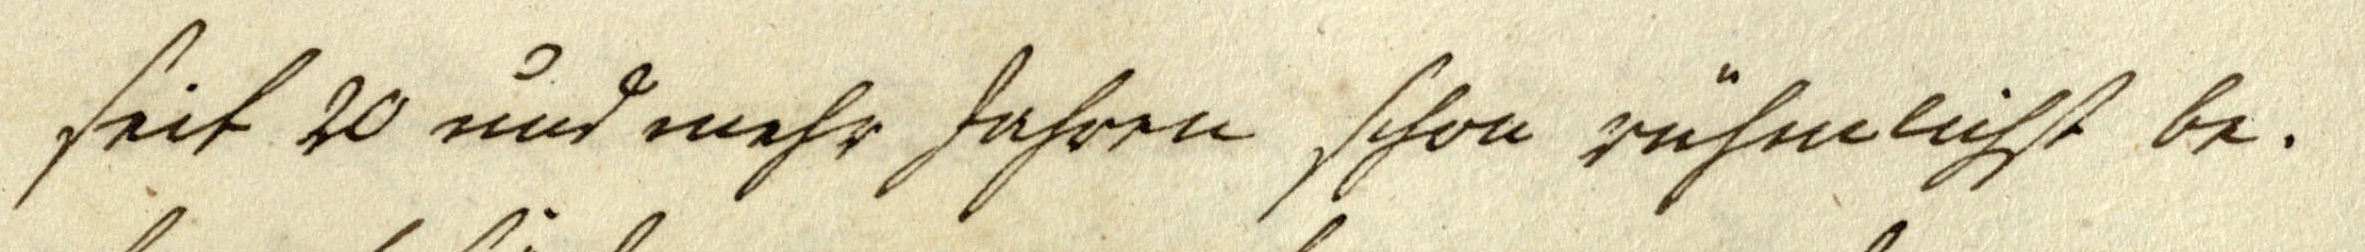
seit 20 und mehr Jahren schon rühmlichst be¬
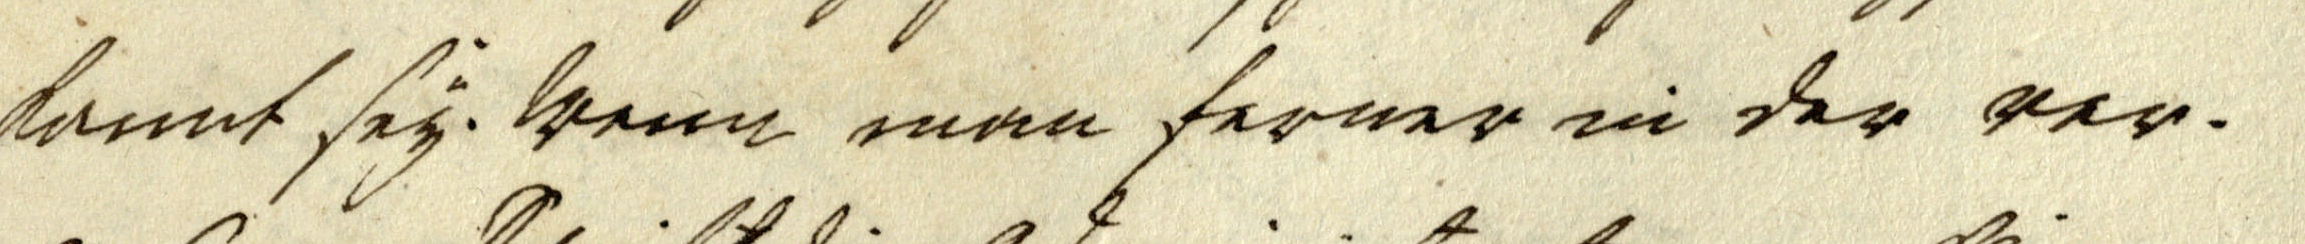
kannt seÿ. Wenn man ferner in der ver¬
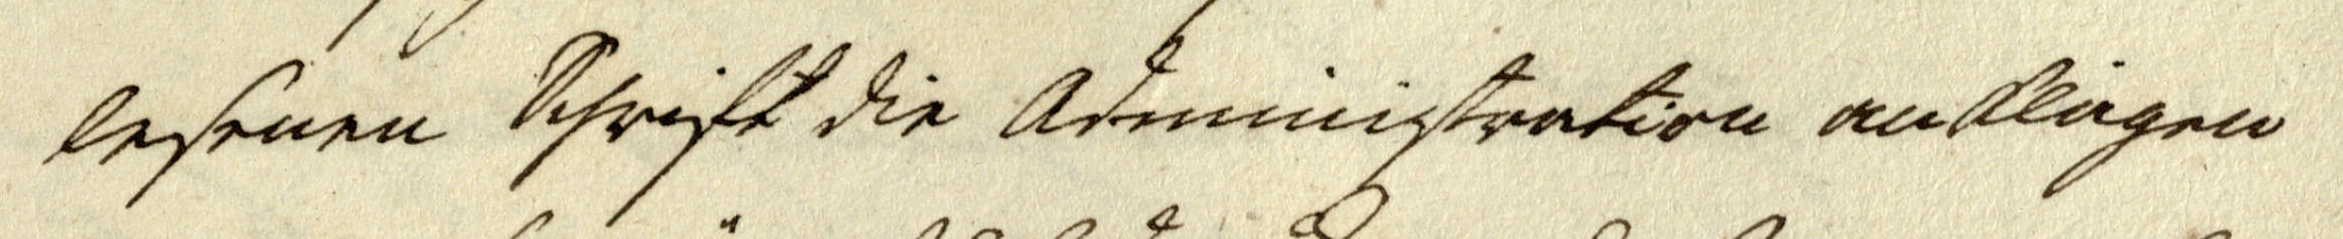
lesenen Schrift die Administration anklagen
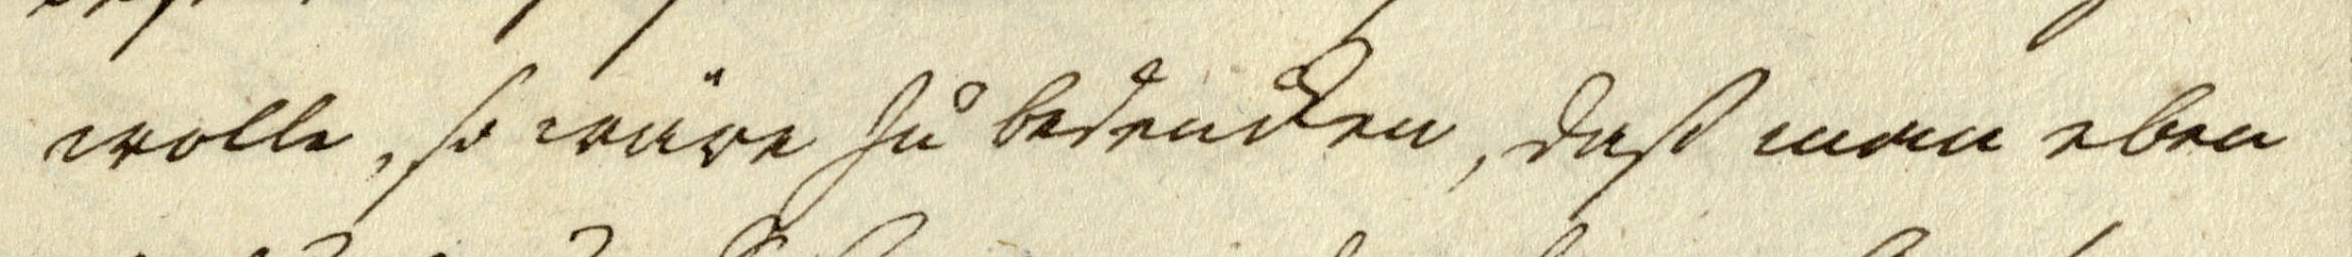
wolle, so wäre zu bedencken, daß man eben
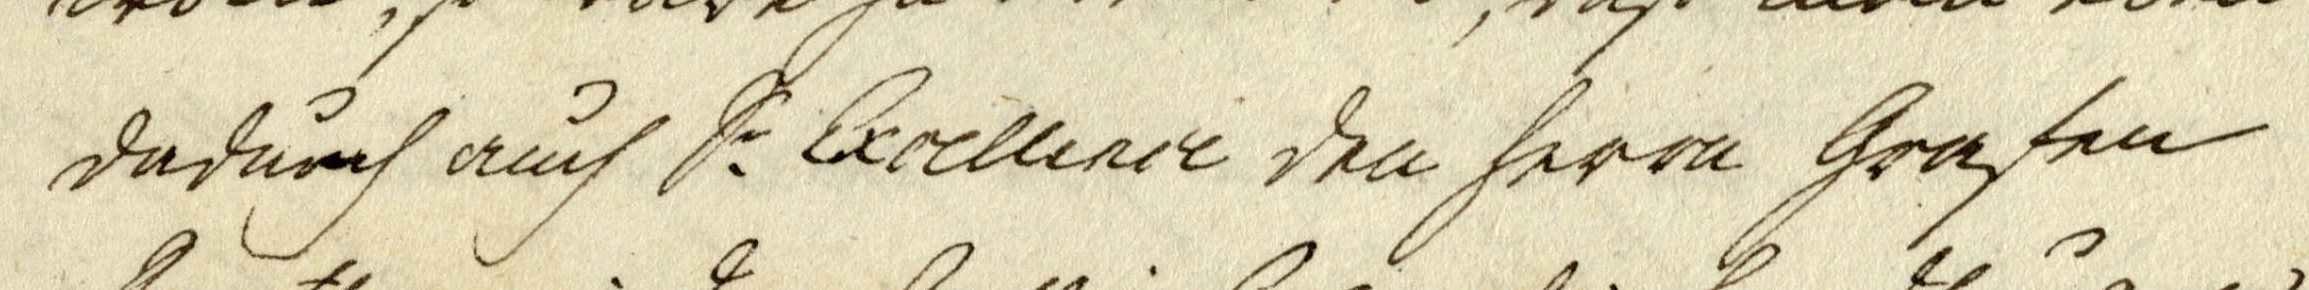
dadurch auch Sr Excellence den Herrn Grafen
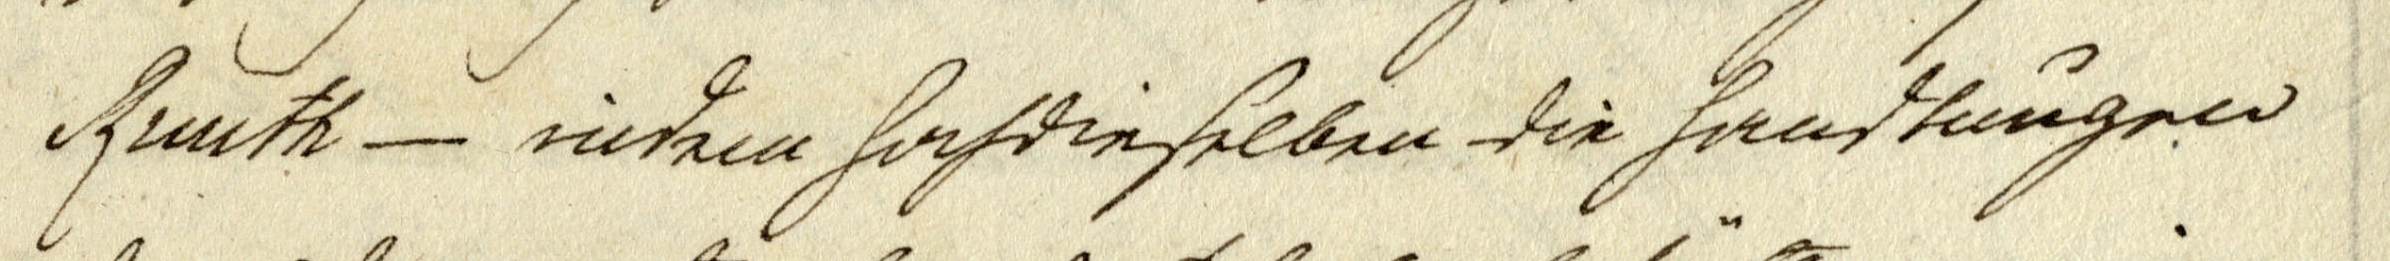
Ruuth indem Hochdieselben die Handlungen
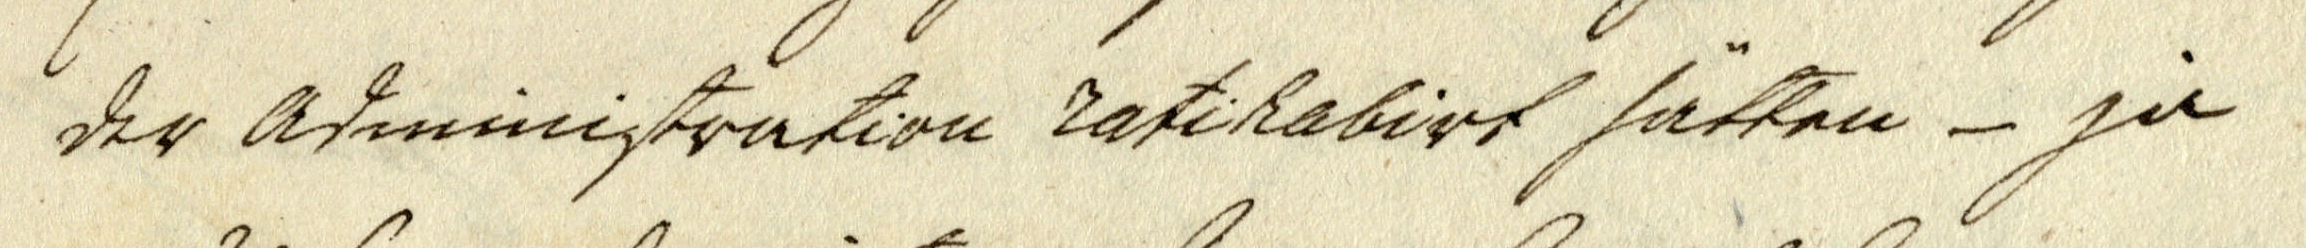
der Administration ratihabirt hätten ja
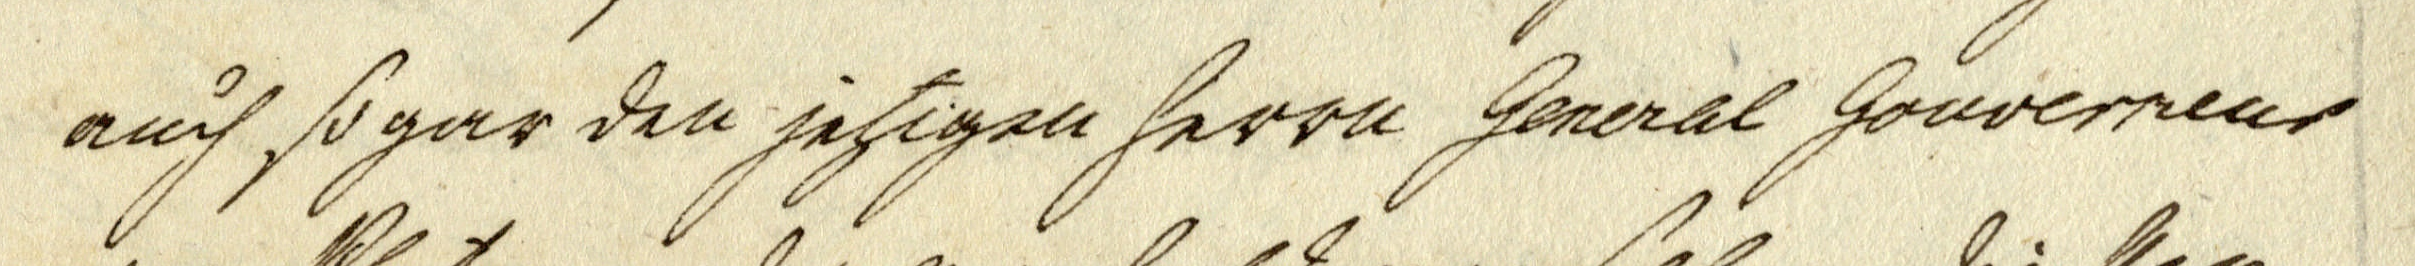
auch sogar den jetzigen Herrn General Gouverneur
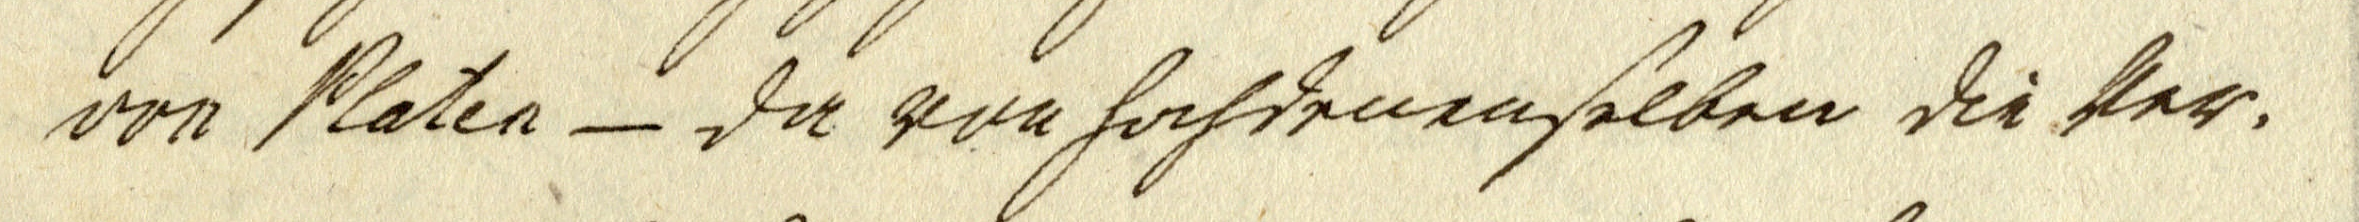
von Platen da von Hochdenenselben die Ver¬
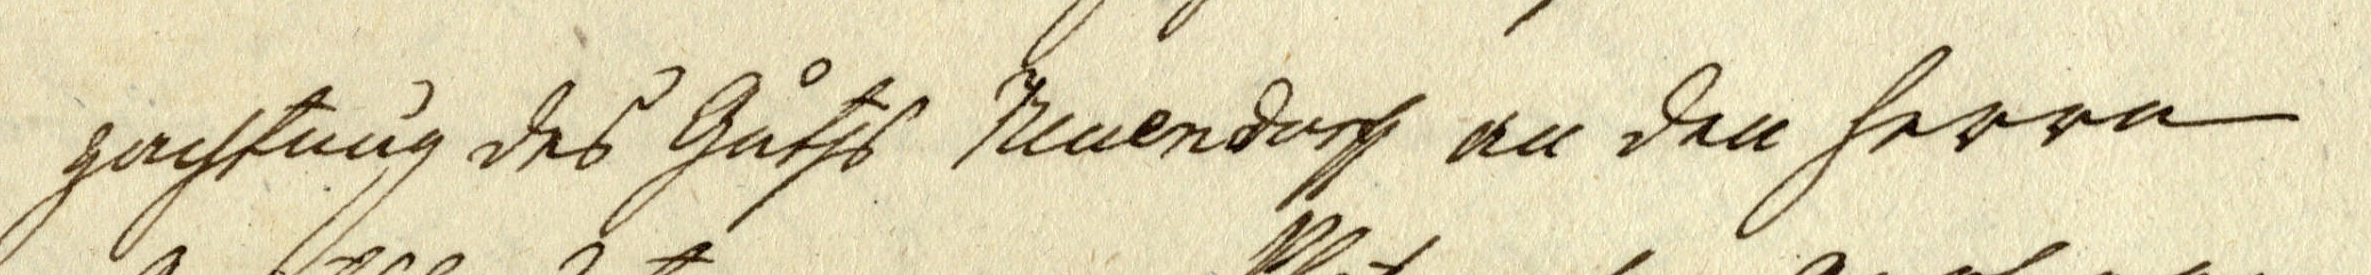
pachtung des Guths Neuendorff an den Herrn
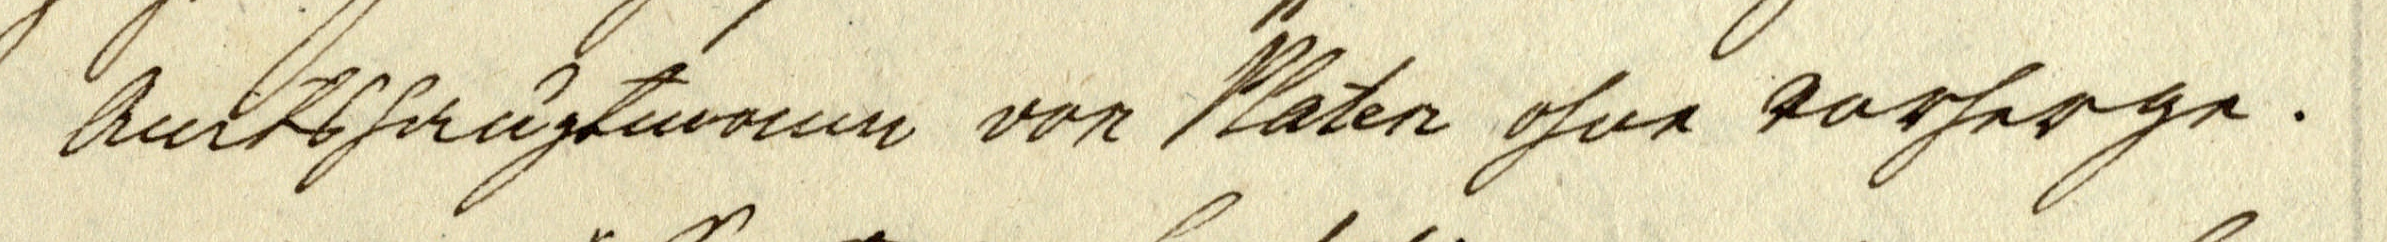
Amtshauptmnn von Platen von vorherge¬
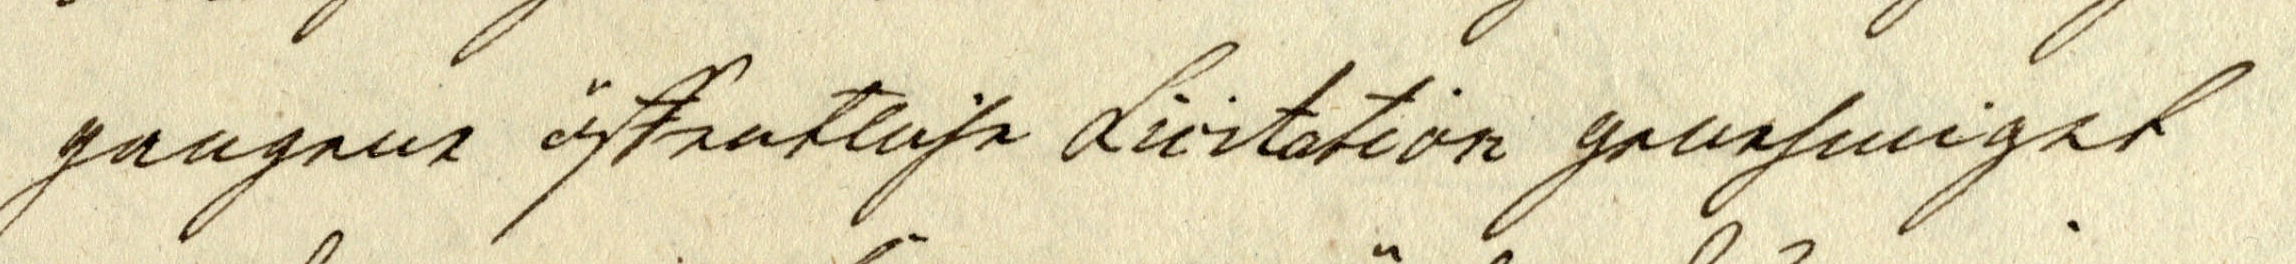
gangene öffentliche Licitation genehmiget
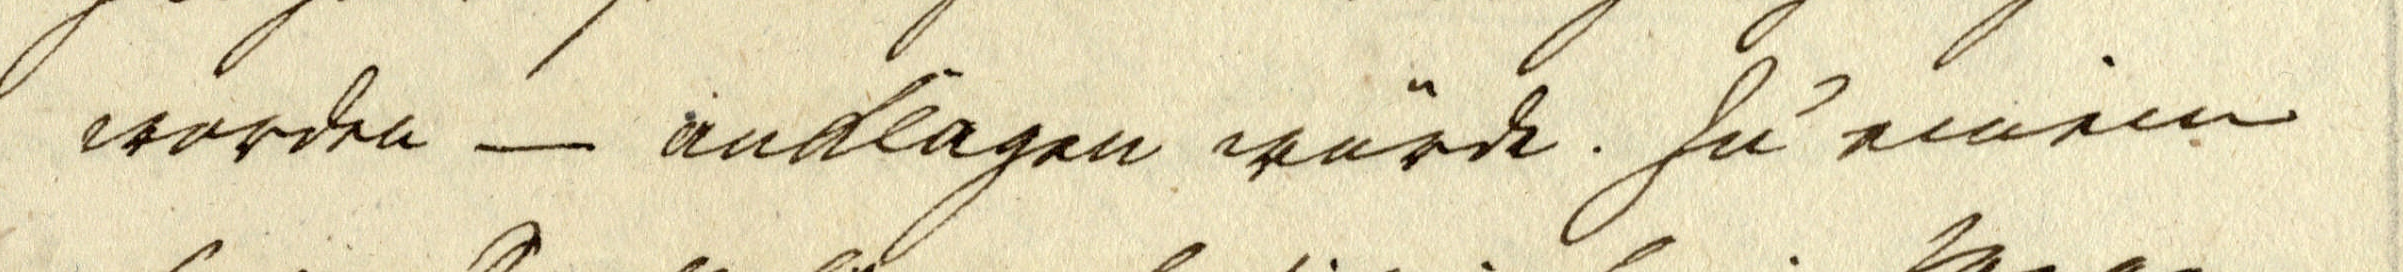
worden anklagen würde. Zu einem
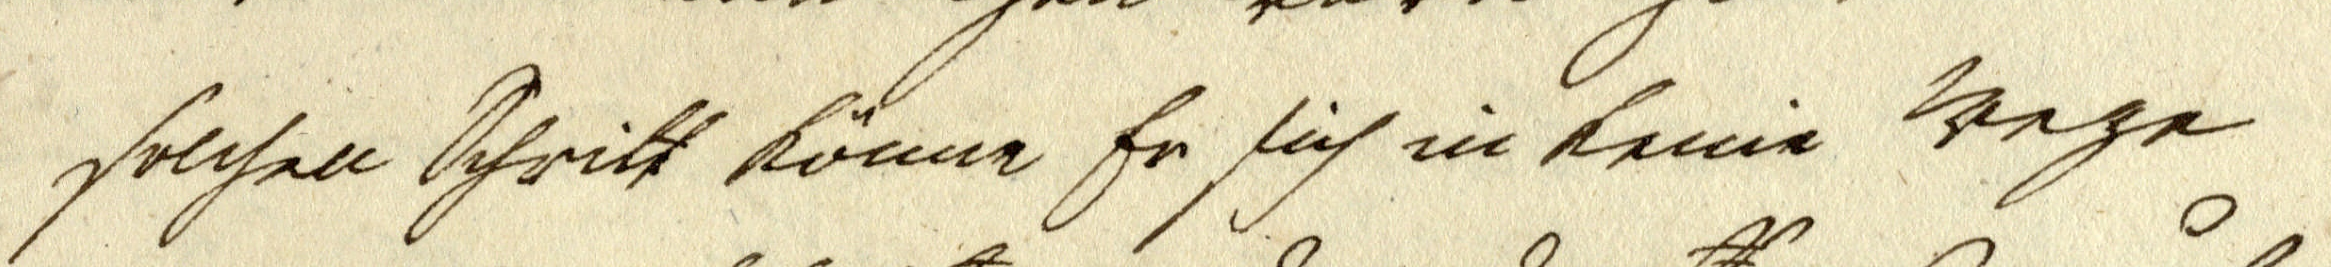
solchen Schritt könne Er sich in keine Wege
